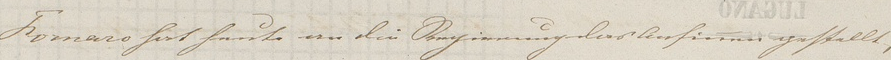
Fornaro hat heute an die Regierung das Ansinnen gestellt,
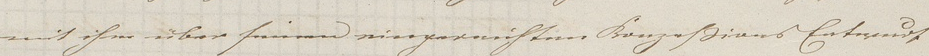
mit ihm über seinen eingereichten Konzeßions Entwurf
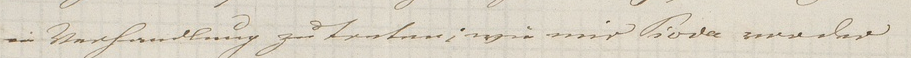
in Verhandlung zu treten; wie mir Pioda vor der
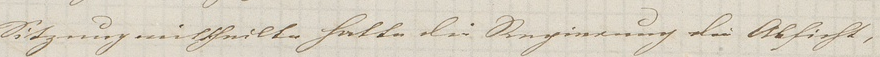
Sitzung mittheilte hatte die Regierung die Absicht,
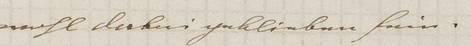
wohl dabei geblieben sein.
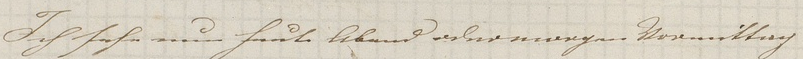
Ich sehe nun heute Abend oder morgen Vormittag
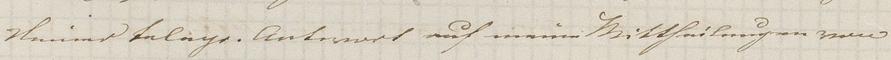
Deiner telegr. Antwort auf meine Mittheilungen von
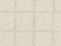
Der
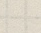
Deine
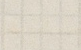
Peyer im
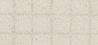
Lugano,
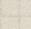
den
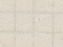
Octob
